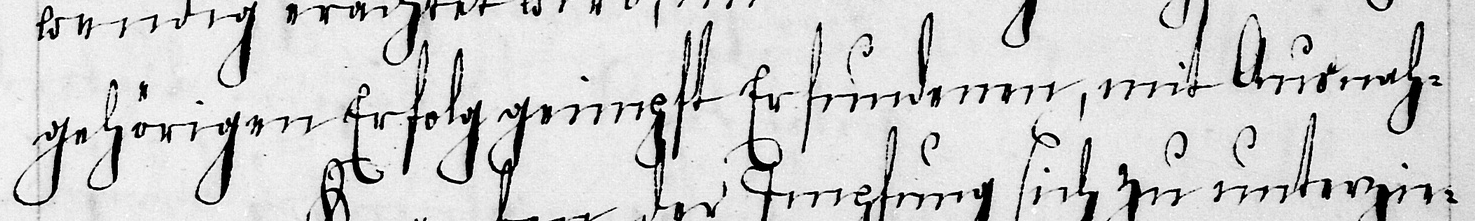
gehörigen Erfolg geimpft Erfundenen, mit Ausnah¬
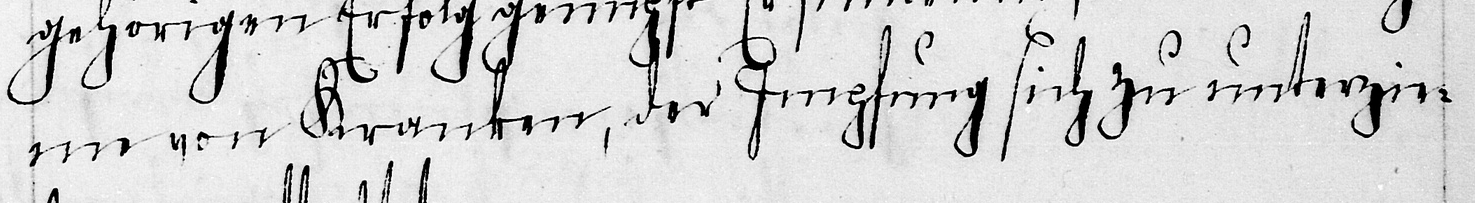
me von Kranken, der Impfung sich zu unterzie¬
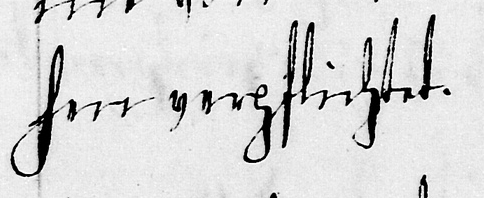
hen verpflichtet.
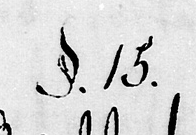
§. 15.
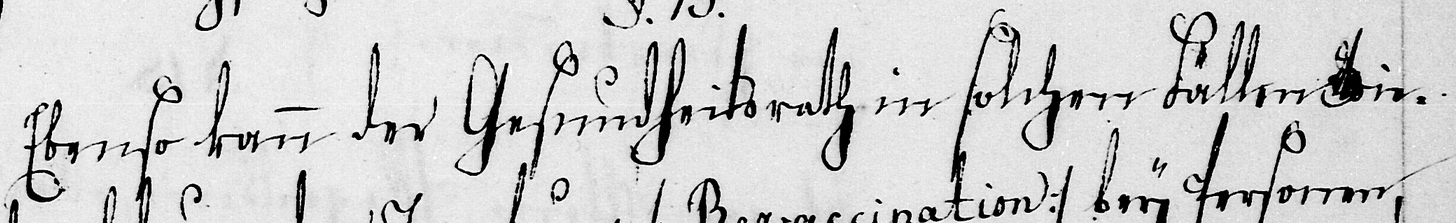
Ebenso kann der Gesundheitsrath in solchen Fällen Wie¬
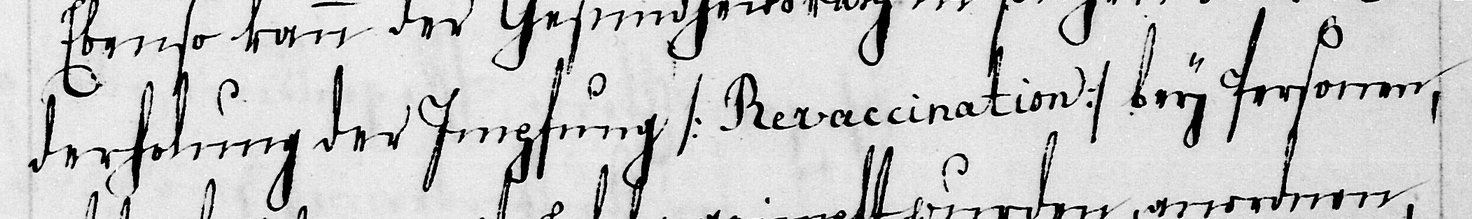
derholung der Impfung [Revaccination] bey Personen,
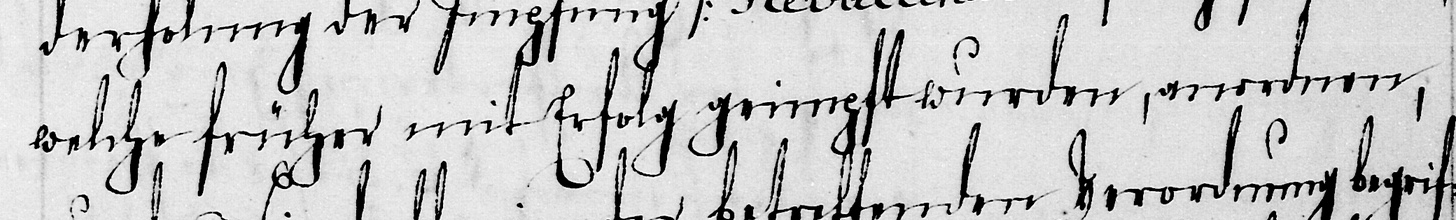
welche früher mit Erfolg geimpft wurden, anordnen,
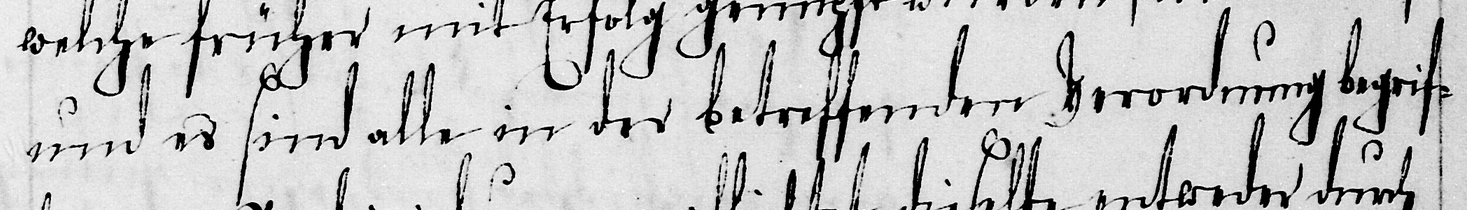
und es sind alle in der betreffenden Verordnung begrif¬
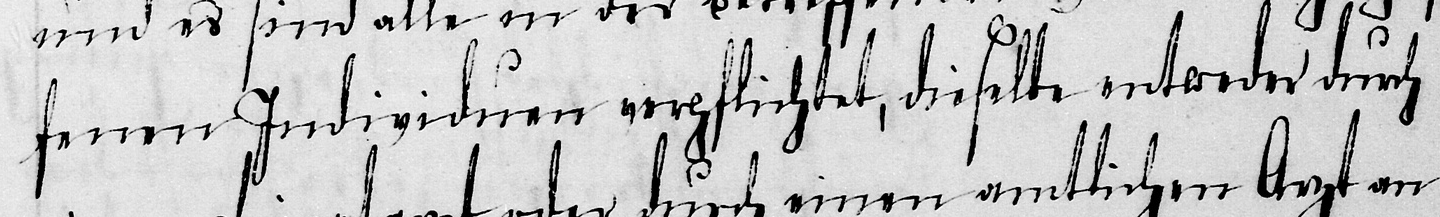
fenen Individuen verpflichtet, dieselbe entweder durch
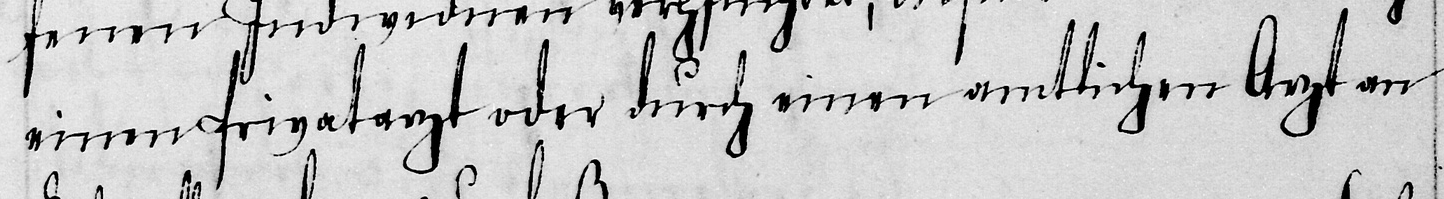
einen Privatarzt oder durch einen amtlichen Arzt an
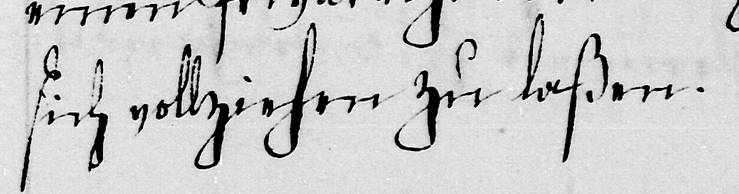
sich vollziehen zu laßen.
